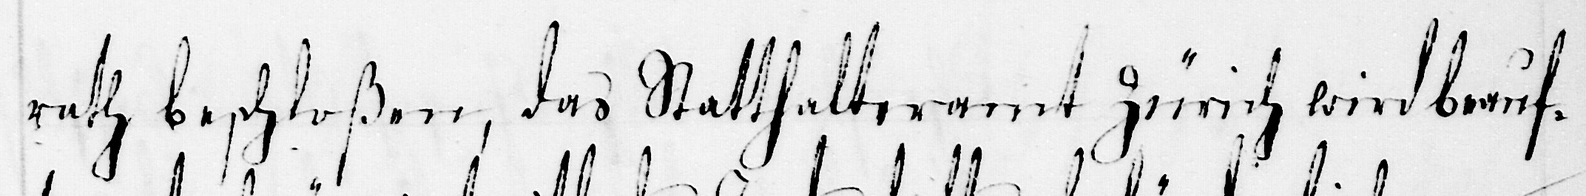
rath beschloßen, das Statthalteramt Zürich wird beauf¬
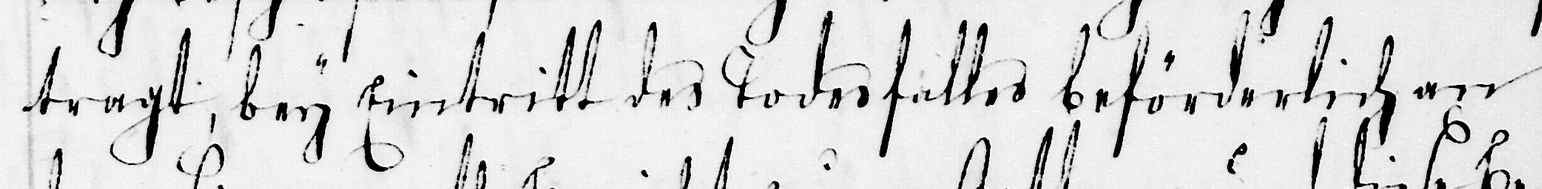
tragt, bey Eintritt des Todesfalles beförderlich an
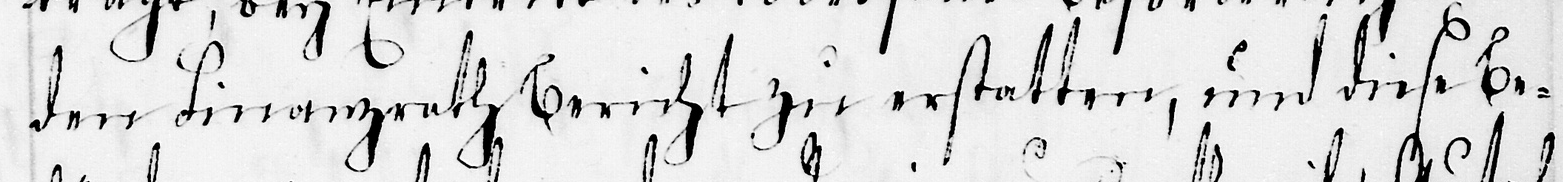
den Finanzrath Bericht zu erstatten, und diese Be¬
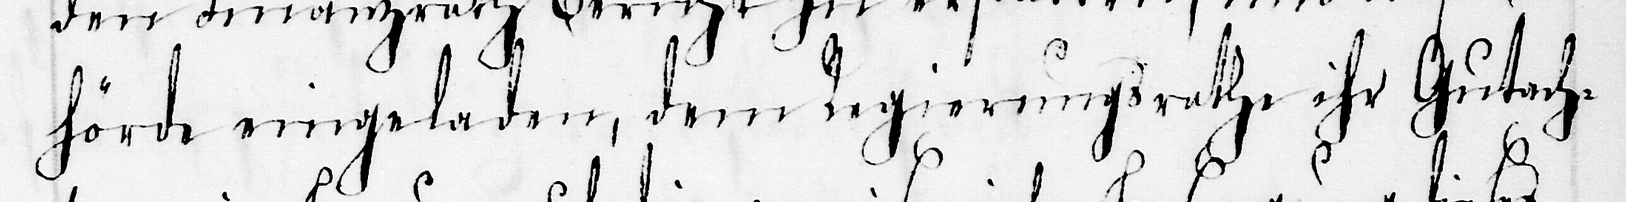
hörde eingeladen, dem Regierungsrathe ihr Gutach¬
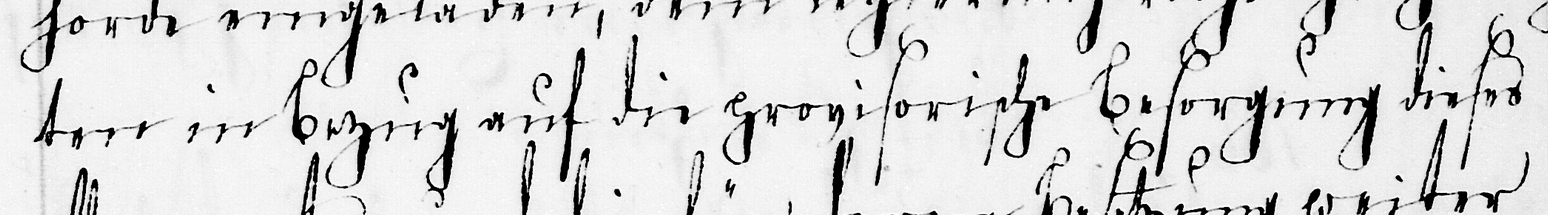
ten in Bezug auf die provisorische Besorgung dieses
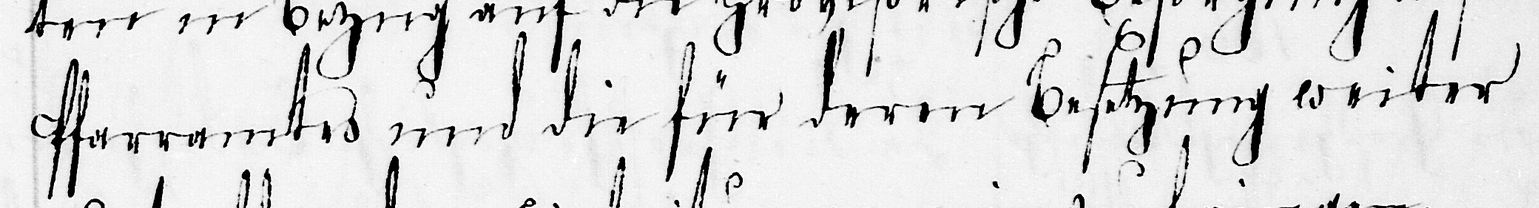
Pfarramtes und die für deren Besetzung weiter
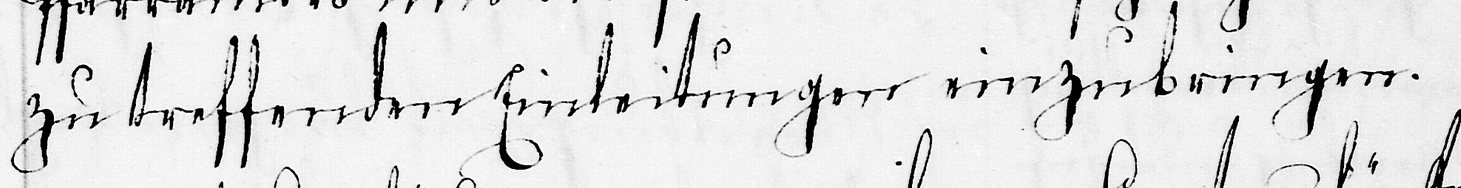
zu treffenden Einleitungen einzubringen.
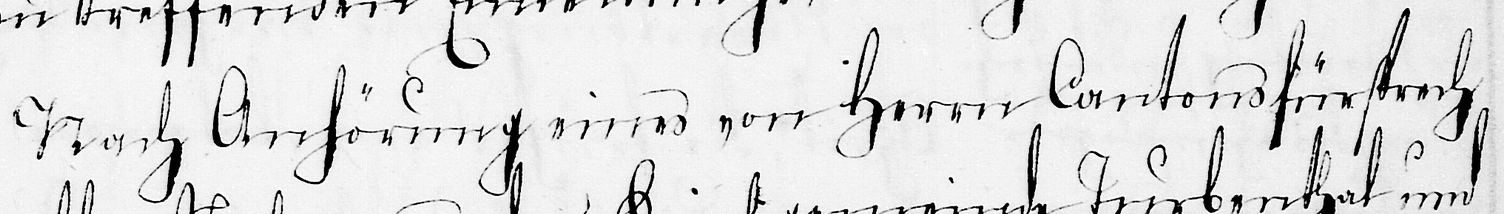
Nach Anhörung eines von Herrn Cantonsfürsprech
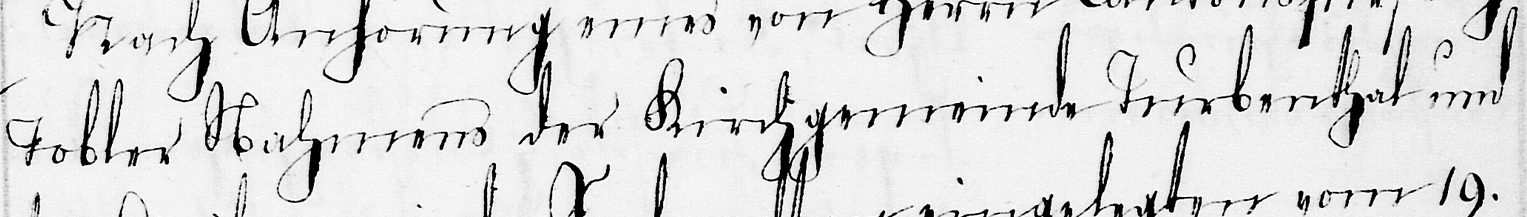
Tobler Nahmens der Kirchgemeinde Turbenthal und
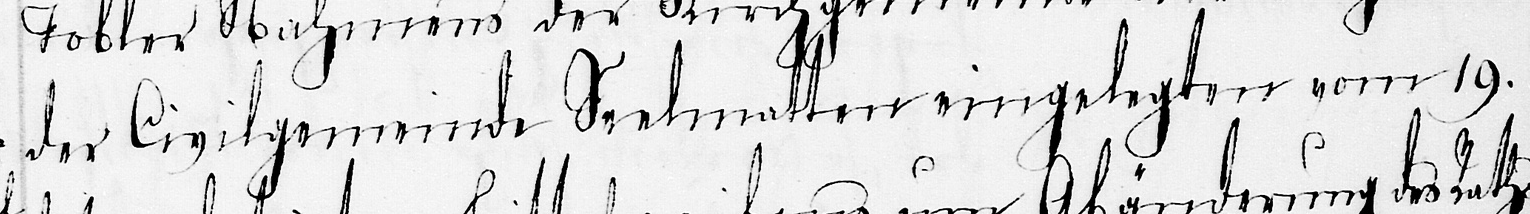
der Civilgemeinde Seelmatten eingelegten vom 19.
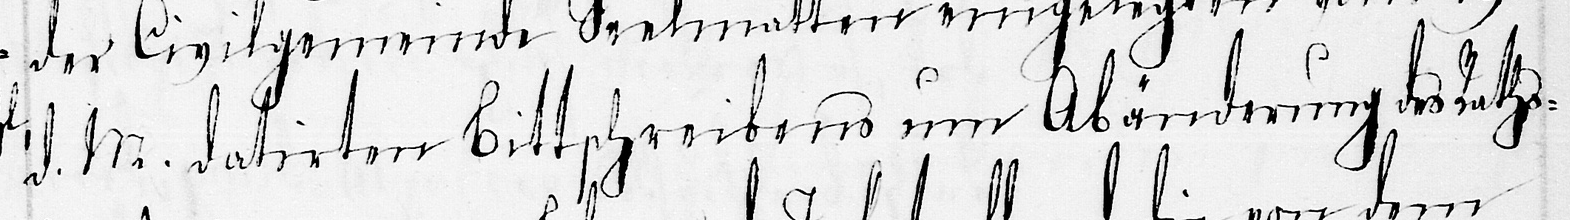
d. M. datirten Bittschreibens um Abänderung des Raths¬
